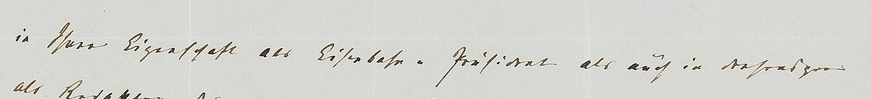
in Ihrer Eigenschaft als Eisenbahn-Präsident als auch in derjenigen
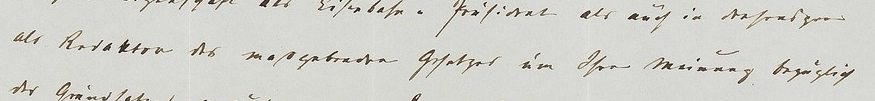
als Redaktor des maßgebenden Gesetzes um Ihre Meinung bezüglich
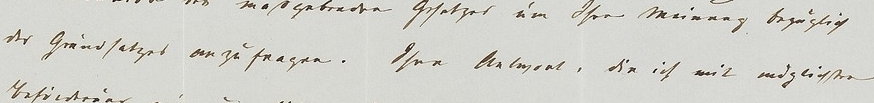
des Grundsatzes anzufragen. Ihre Antwort, die ich mit möglichster
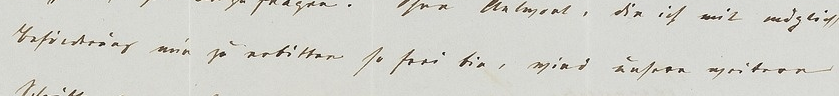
Versicherung mir zu erbitten so frei bin, wird unsere weitern
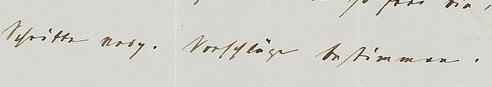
Schritte resp. Vorschläge bestimmen.
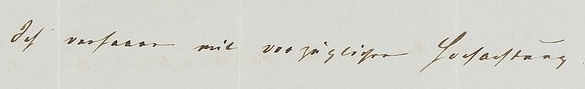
Ich verharre mit vorzüglicher Hochachtung
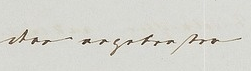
dero ergebenster
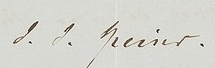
J. J. Speiser
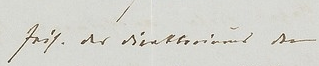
Präs. des Direktoriums der
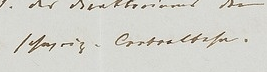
schweiz. Centralbahn.
